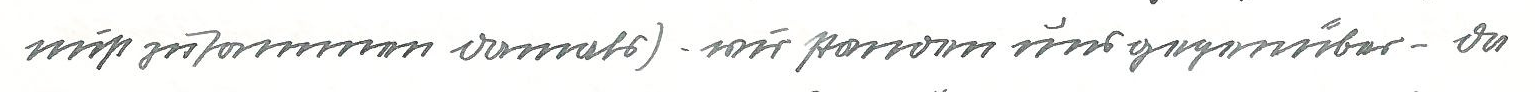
nicht zusammen damals) wir standen uns gegenüber – da
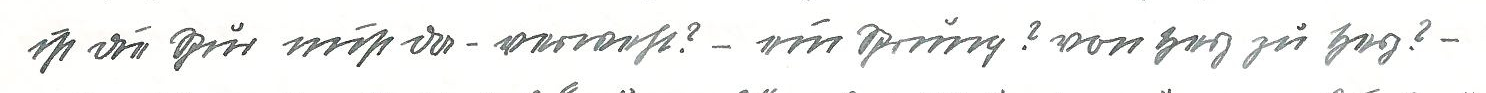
ist die Spur nicht da – verwest? – ein Sprung? von Herz zu Herz? –
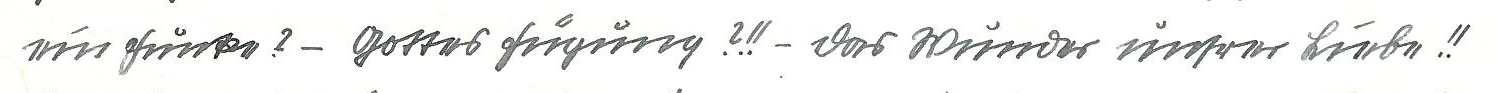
ein Funke? – Gottes Fügung?!! – Das Wunder unsrer Liebe!!
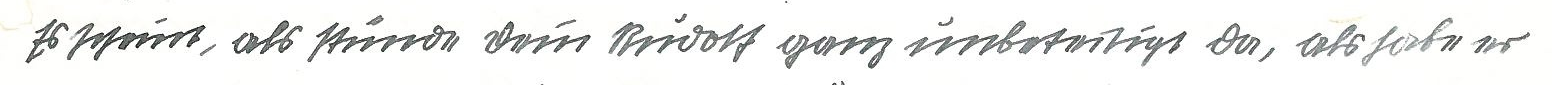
Es scheint, als stünde Dein ganz unbeteiligt da, als habe er
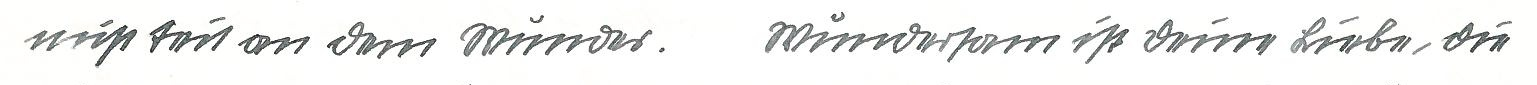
nicht teil an dem Wunder. Wundersam ist Deine Liebe, die
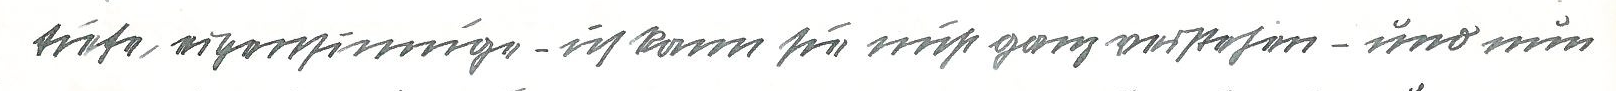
tiefe, eigensinnige – ich kann sie nicht ganz verstehen – und nun
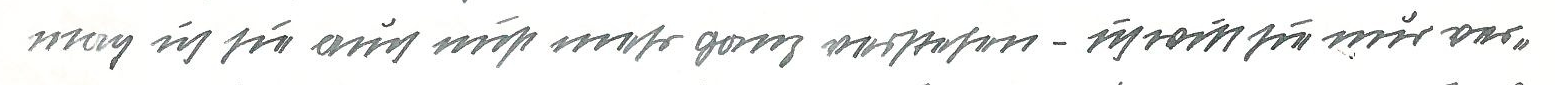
mag ich sie auch nicht mehr ganz verstehen – ich will sie nur ver¬
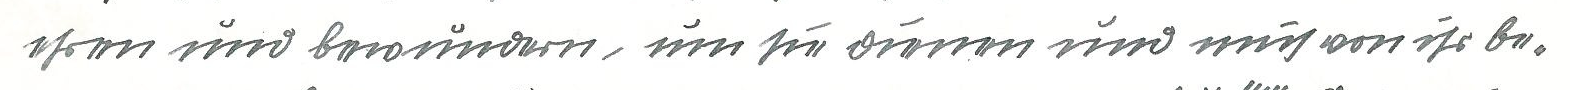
ehren und bewundern, um sie dienen und mich von ihr be¬
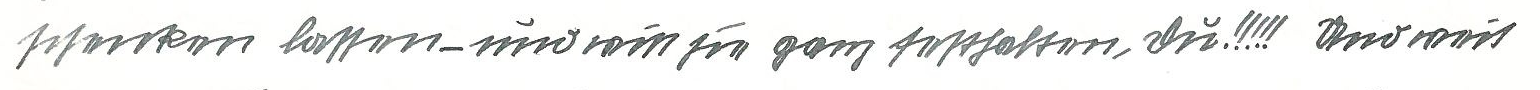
schenken lassen – und will sie ganz festhalten, Du!!!!! Und weil
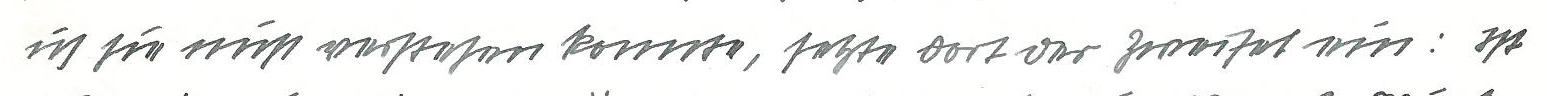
ich sie nicht verstehen konnte, setzte dort der Zweifel ein: Ist
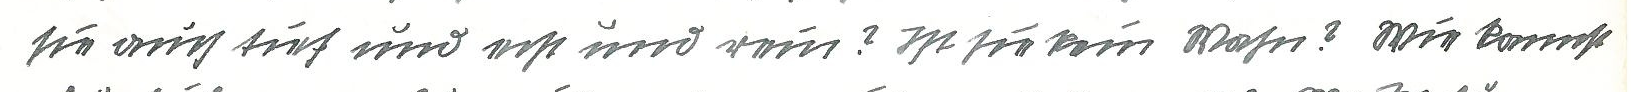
sie auch tief und echt und rein? Ist sie kein Wahn? Wie kannst
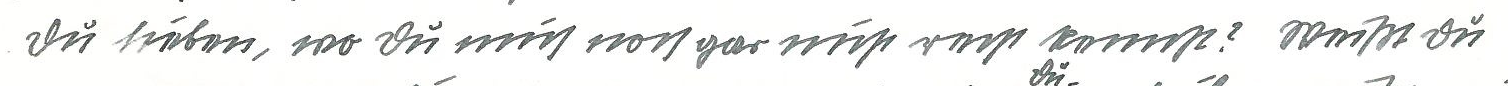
Du lieben, wo Du mich noch gar nicht recht kennst? Weißt Du
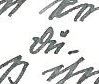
Du
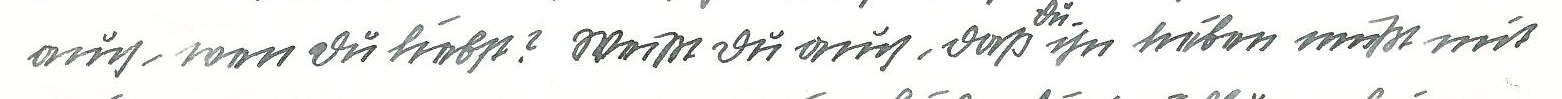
auch, wen Du liebst? Weißt Du auch, daß ihn lieben mußt mit
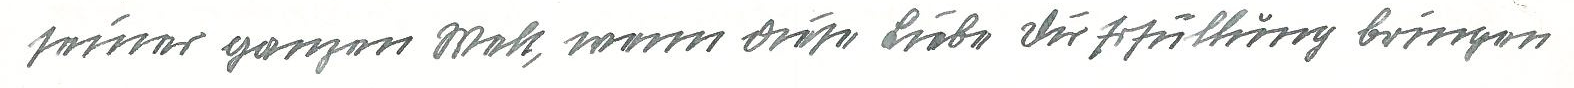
seiner ganzen Welt, wenn diese Liebe Dir Erfüllung bringen
